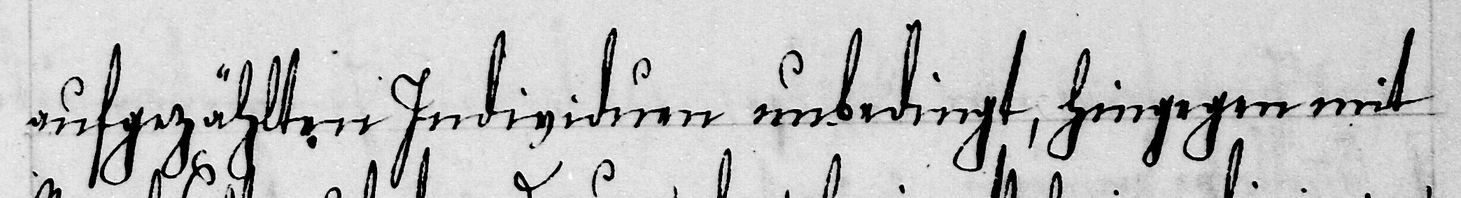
aufgezählten Individuen unbedingt, hingegen mit
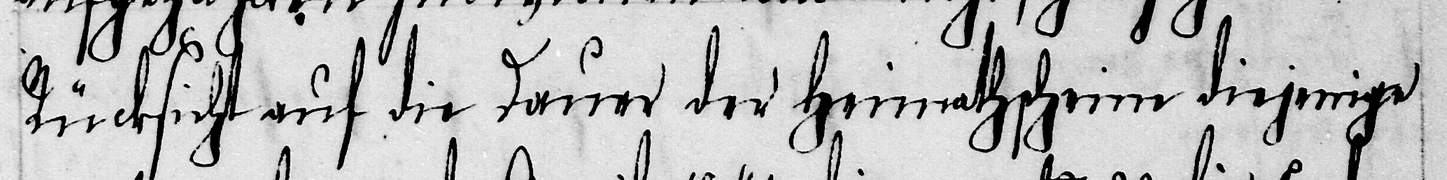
Rücksicht auf die Dauer der Heimathscheine diejenige
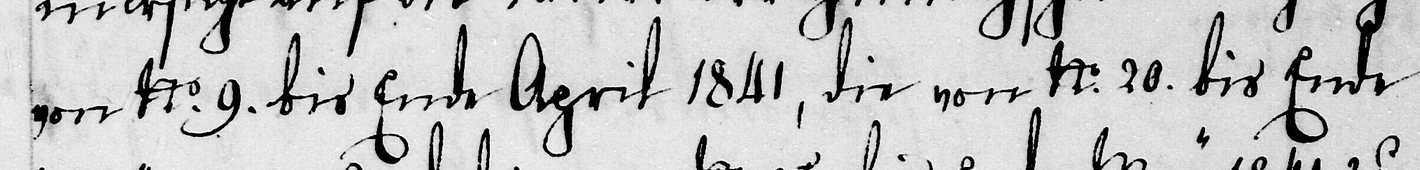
von No. 9 bis Ende April 1841, die von No. 20. bis Ende
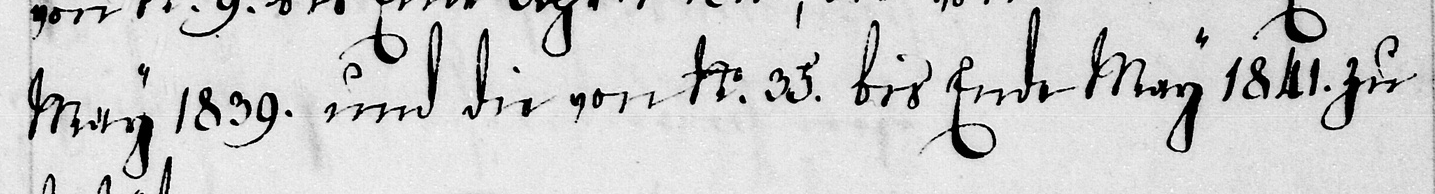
May 1839. und die von No. 35. bis Ende May 1841. zu
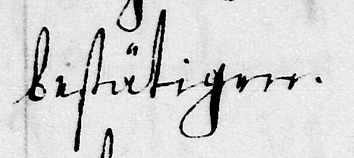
bestätigen.
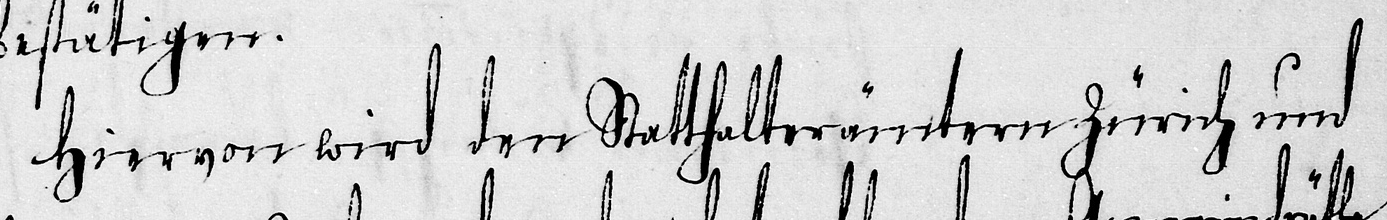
Hiervon wird dem Statthalterämtern Zürich und
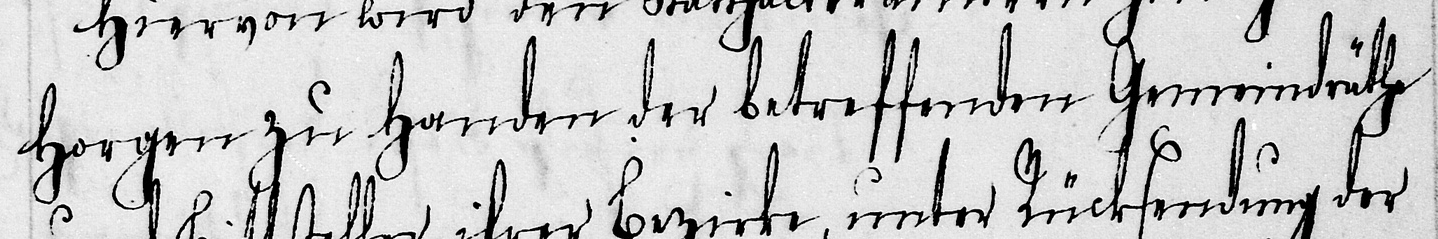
Horgen zu Handen der betreffenden Gemeindräthe
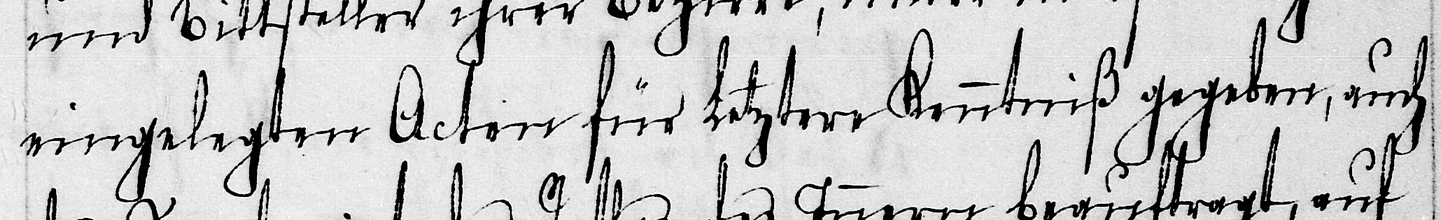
eingelegten Acten für Letztere Kenntniß gegeben, auch
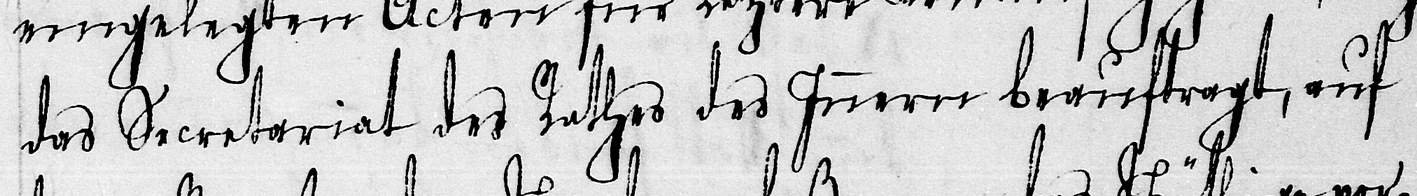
das Secretariat des Rathes des Innern beauftragt, auf
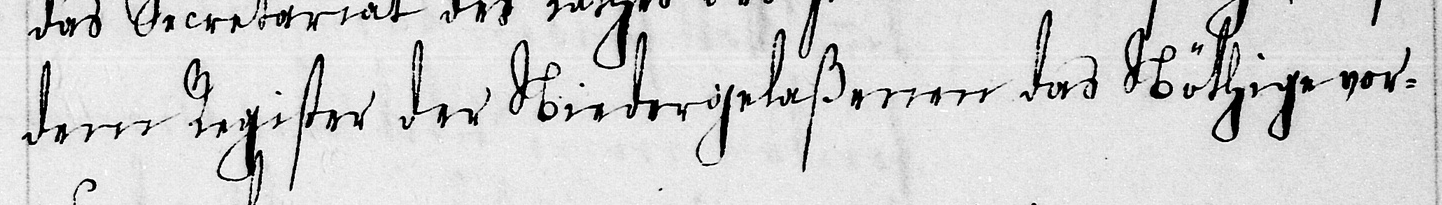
dem Register der Niedergelaßenen das Nöthige vor¬
